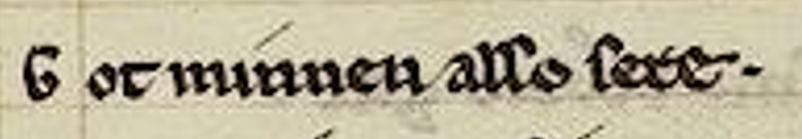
Got minnen alſo ſere.
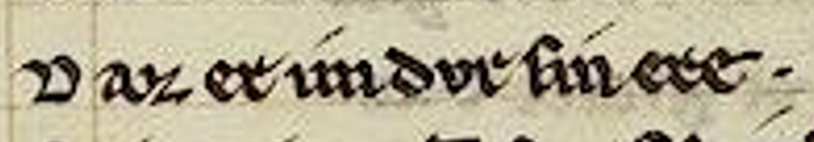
Daz er im dvr ſin ere.
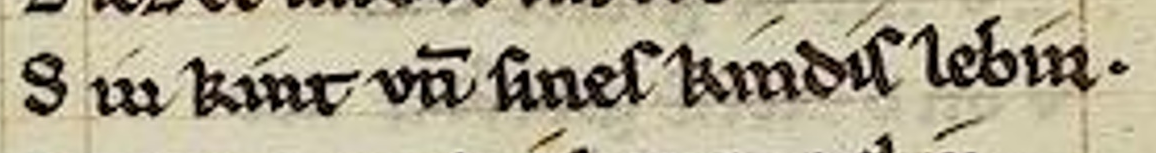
Sin kint vn(d) ſineſ kindiſ lebin.
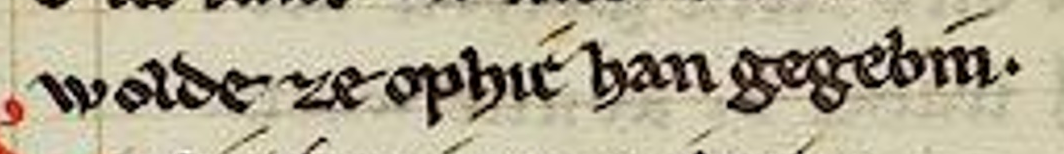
Wolde ze ophir han gegebin.
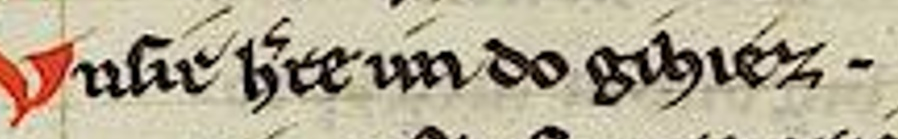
*Vnſir h(er)re im do gihiez.
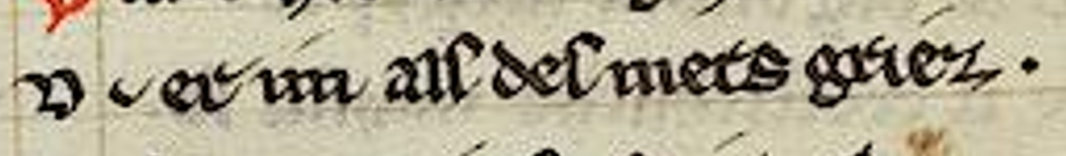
Daz er im alſ deſ mers griez.
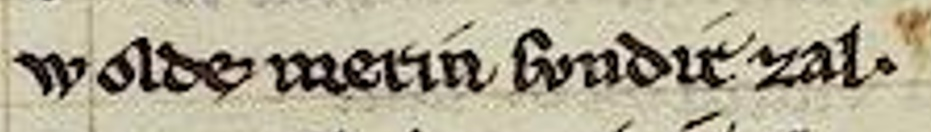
Wolde merin ſvndir zal.
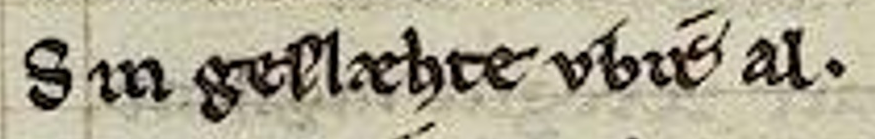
Sin geſl[ae]hte vbir al.
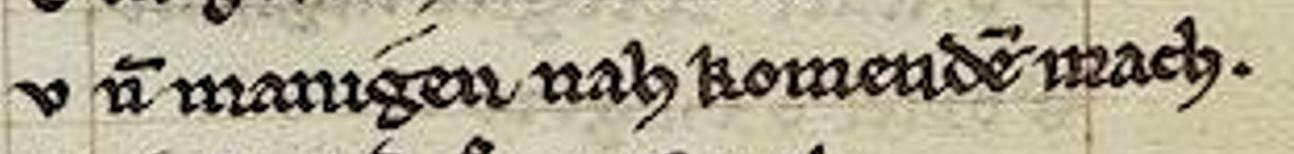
Vn(d) manigen nah komende(n) mach.
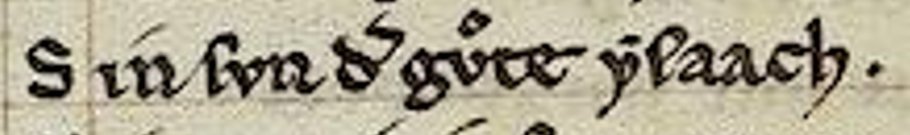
Sin ſvn d(er) gv°ote ysaach.
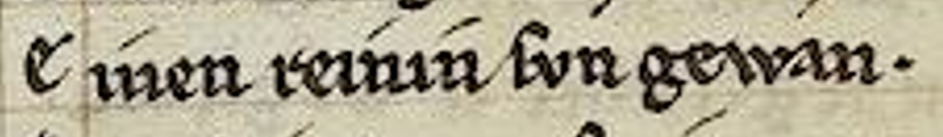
Einen reinin ſvn gewan.
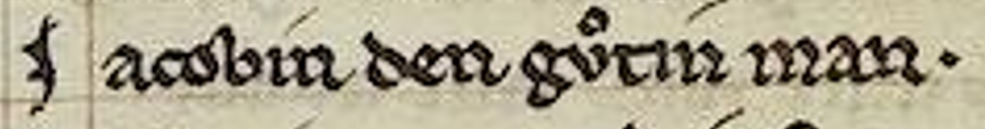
Jacobin den gv°otin man.
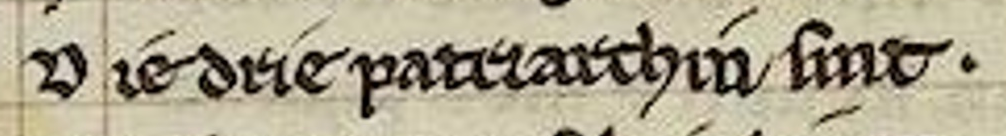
Die dri patriarchin ſint.
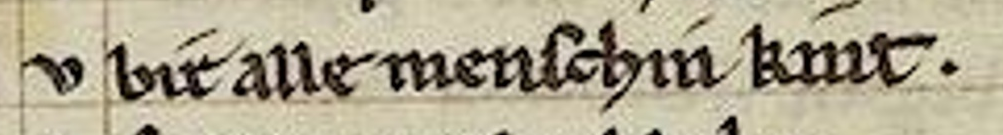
Vbir alle menſchin kint.
